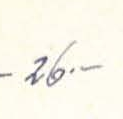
26.
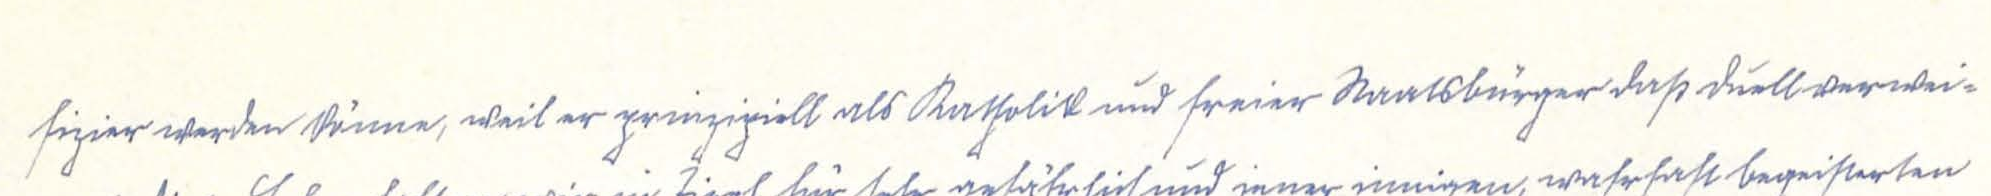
fizier werden könne, weil er prinzipiell als Katholik und freier Staatsbürger das Duell verwei-
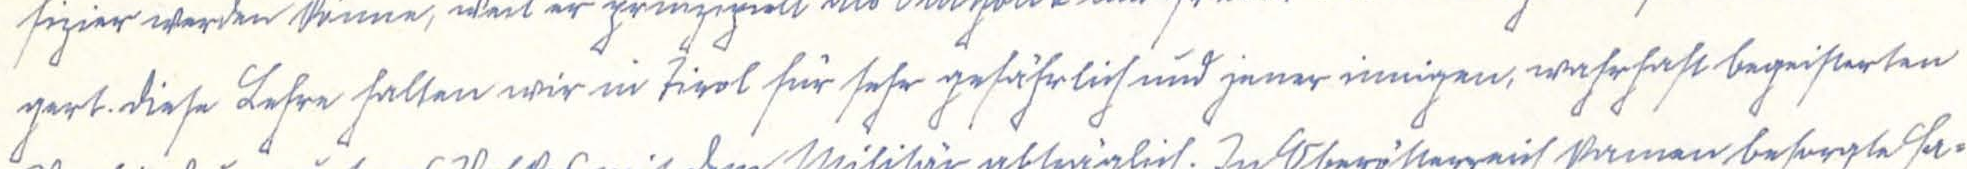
gert. Diese Lehre halten wir in Tirol für sehr gefährlich und jener innigen, wahrhaft begeisterten
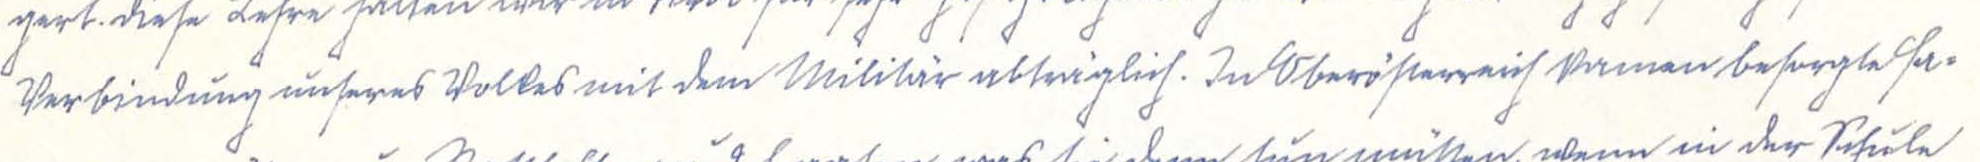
Verbindung unseres Volkes mit dem Militär abträglich. In Oberösterreich kamen besorgte Fa-
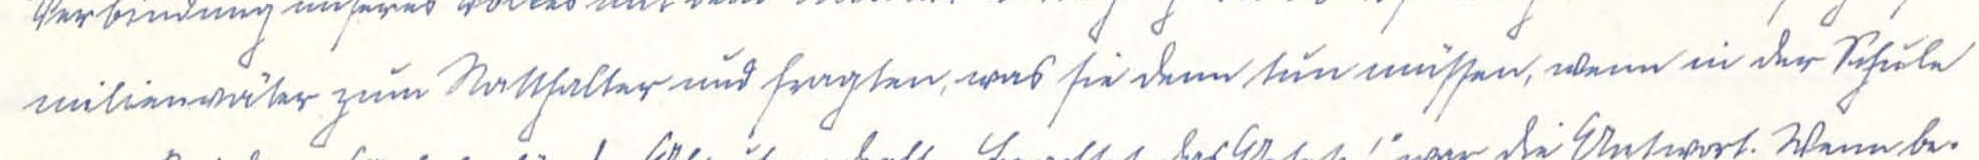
milienväter zum Statthalter und fragten, was sie denn tun müssen, wenn in der Schule
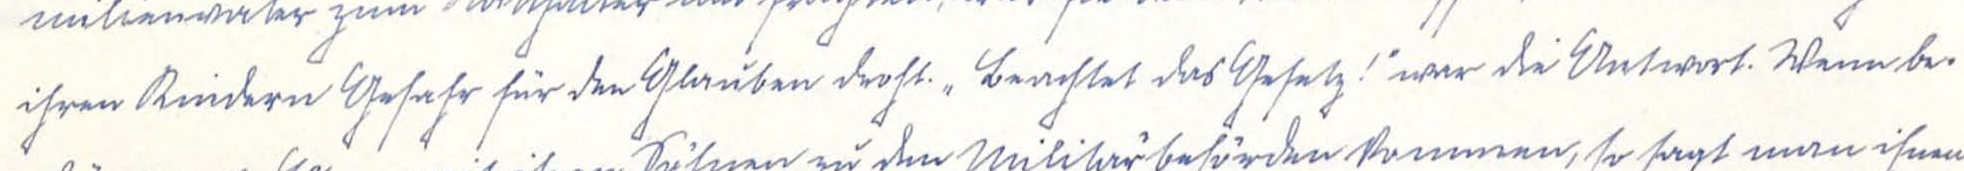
ihren Kindern Gefahr für den Glauben droht. "Beachtet das Gesetz!“ war die Antwort. Wenn be-
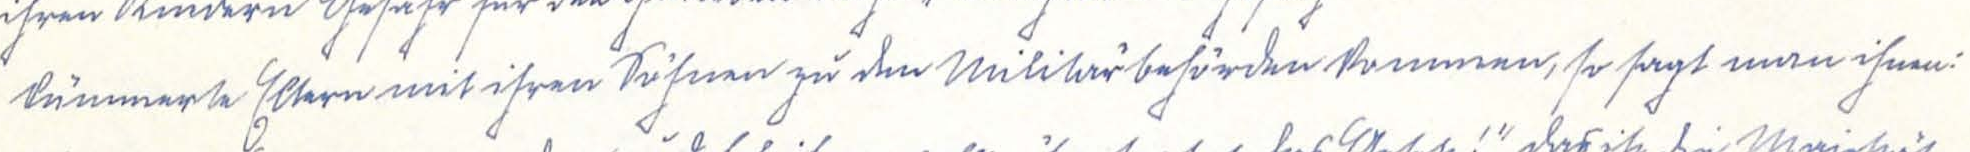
kümmerte Eltern mit ihren Söhnen zu den Militärbehörden kommen, so sagt man ihnen:
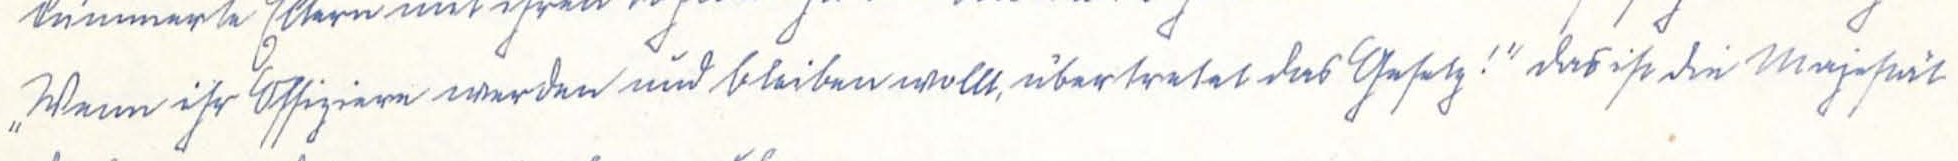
Wenn ihr Ofiziere werden und bleiben wollt, übertretet das Gesetz!“ Das ist die Majestät
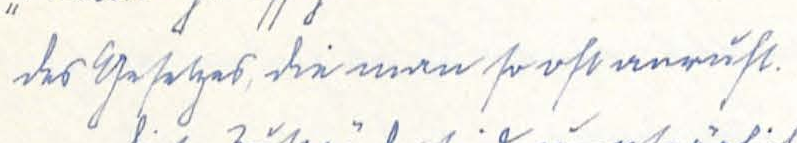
des Gesetzes, die man so oft anruft.
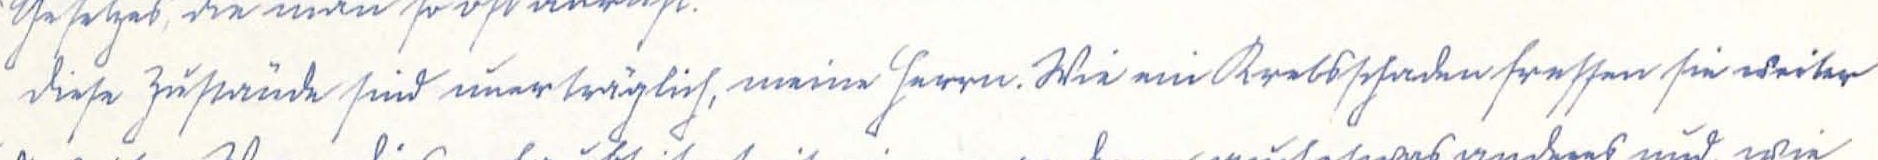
Diese Zustände sind unerträglich, meine Herrn. Wie ein Krebssschaden fressen sie weiter
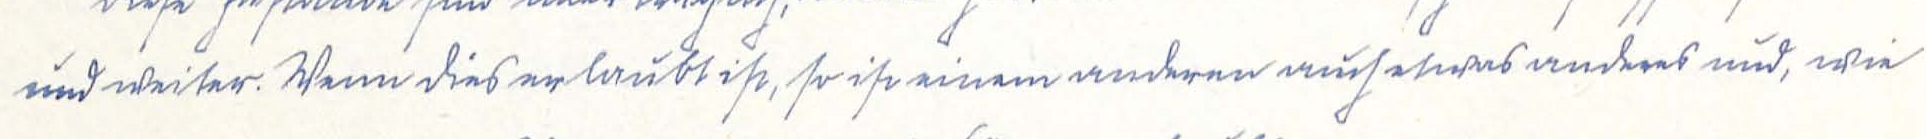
und weiter. Wenn dies erlaubt ist, so ist einem anderen auch etwas anderes und, wie
